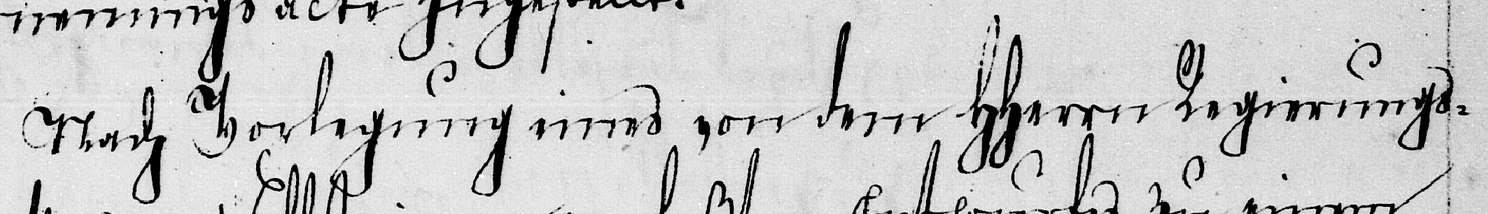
Nach Vorlegung eines von dem HHerrn Regierungs¬
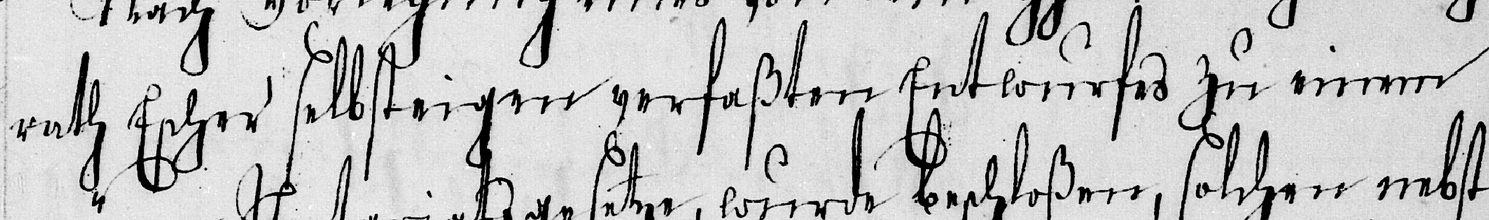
rath Escher selbsteigen verfaßten Entwurfes zu einem
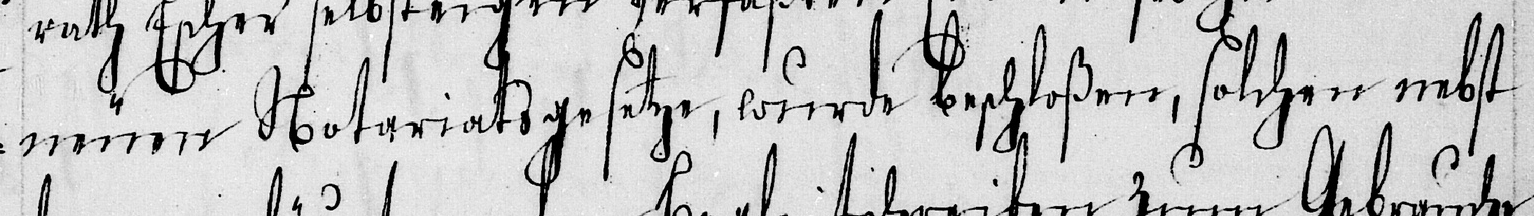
neuen Notariatsgesetze, wurde beschloßen, solchen nebst
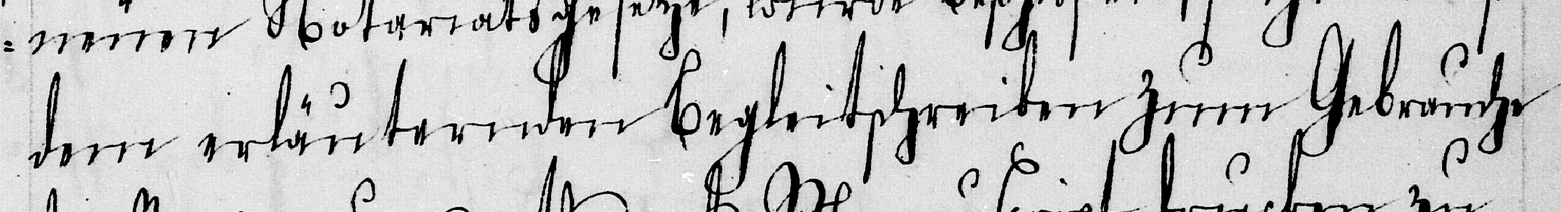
dem erläuternden Begleitschreiben zum Gebrauche
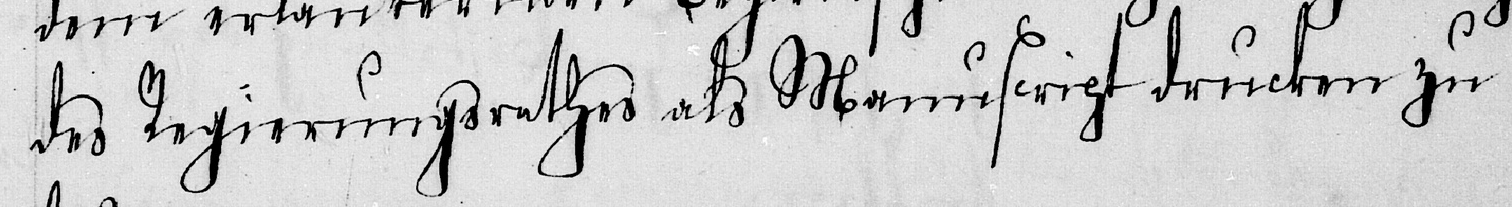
des Regierungsrathes als Manuscript drucken zu
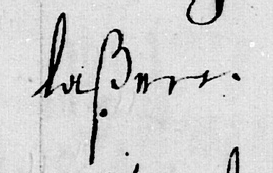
laßen.
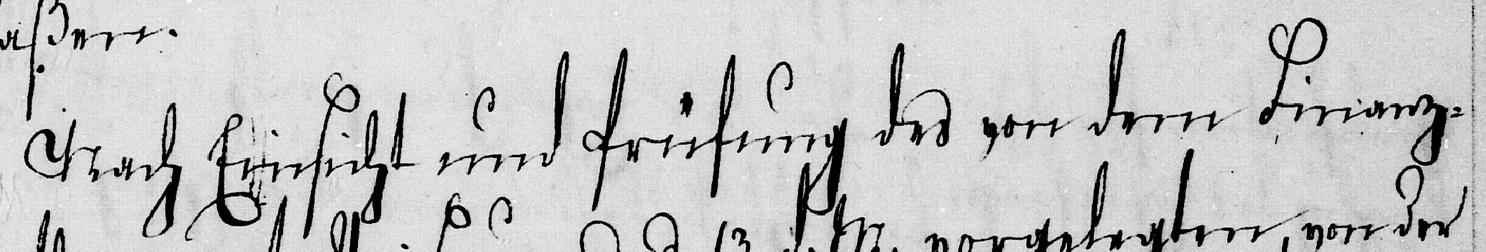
Nach Einsicht und Prüfung des von dem Finanz¬
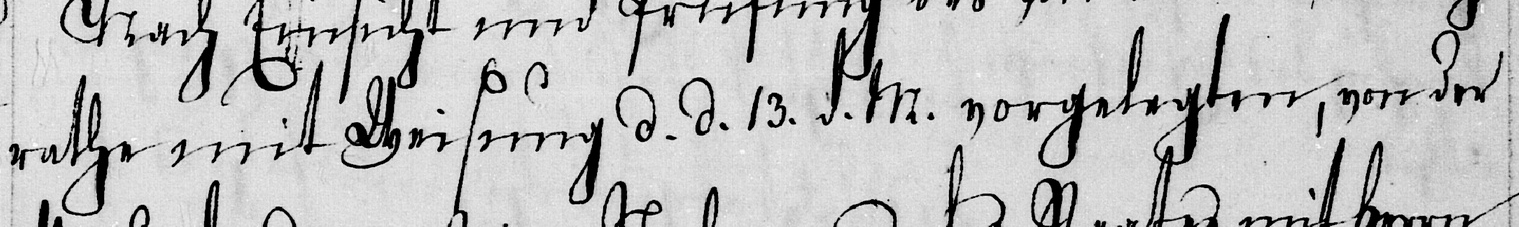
rathe mit Weisung d. d. 13. d. M. vorgelegten, von der
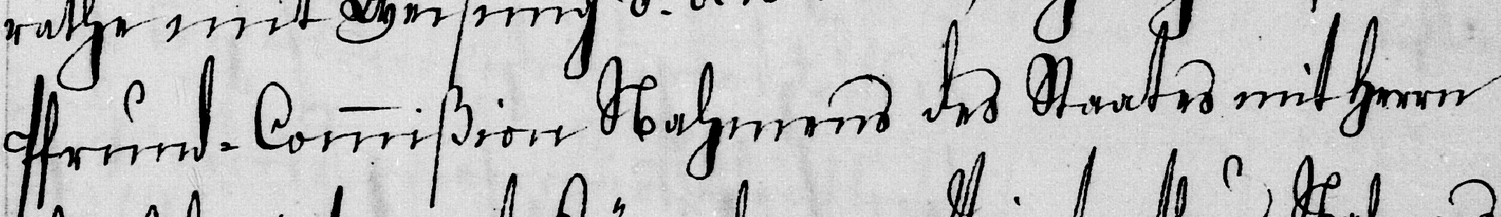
Pfrund-Commißion Nahmens des Staates mit Herrn
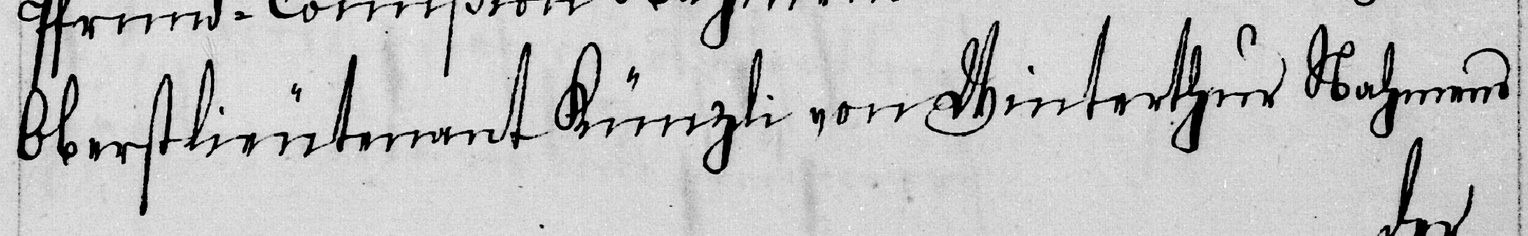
Oberstlieutnant Künzli von Winterthur Nahmens
